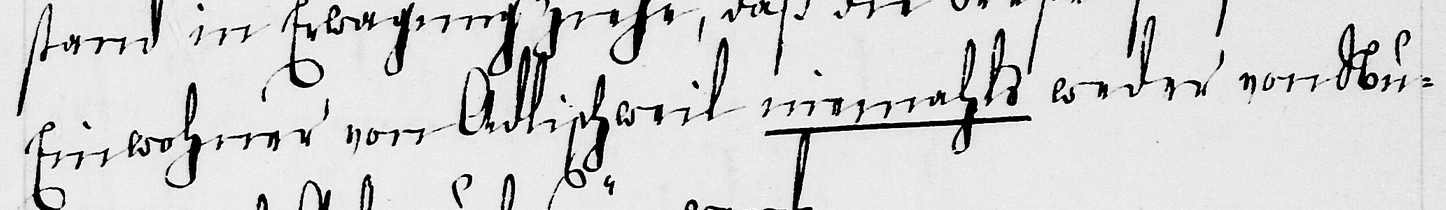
Einwohner von Adlischweil niemahls weder von Nu¬
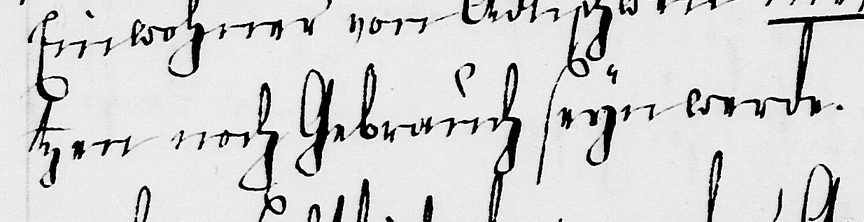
tzen noch Gebrauch seyn werde.
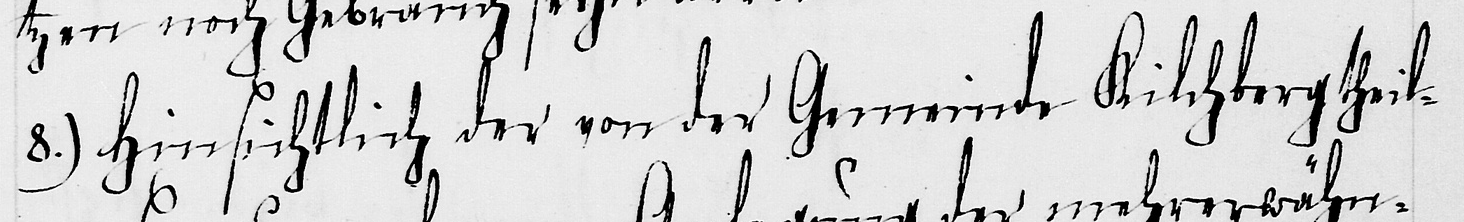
8.) Hinsichtlich der von der Gemeinde Kilchberg theil¬
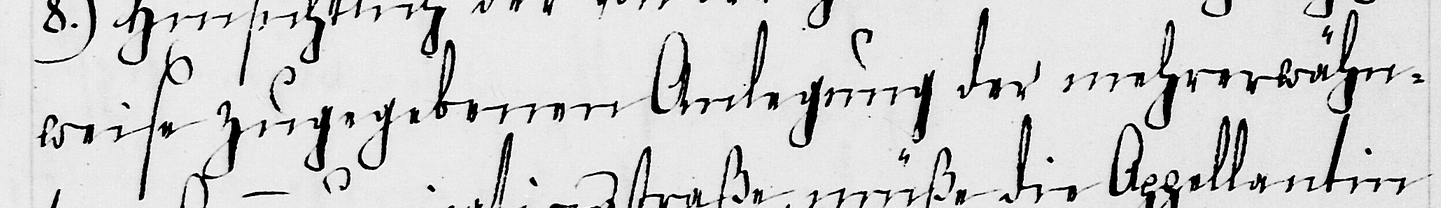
weise zugegebenen Anlegung der mehrerwähn¬
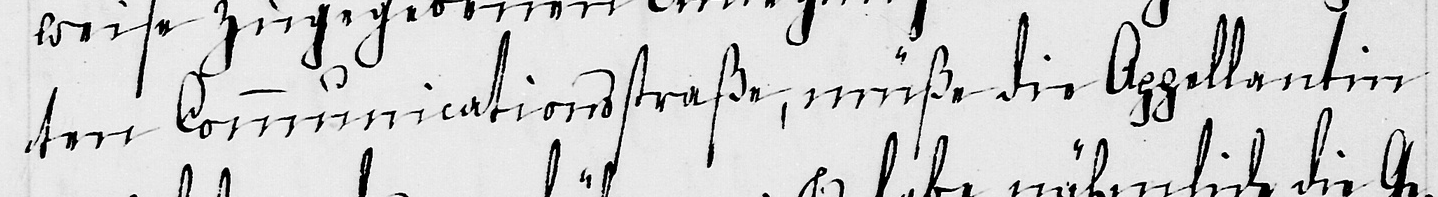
ten Communicationsstraße, müße die Appellantin
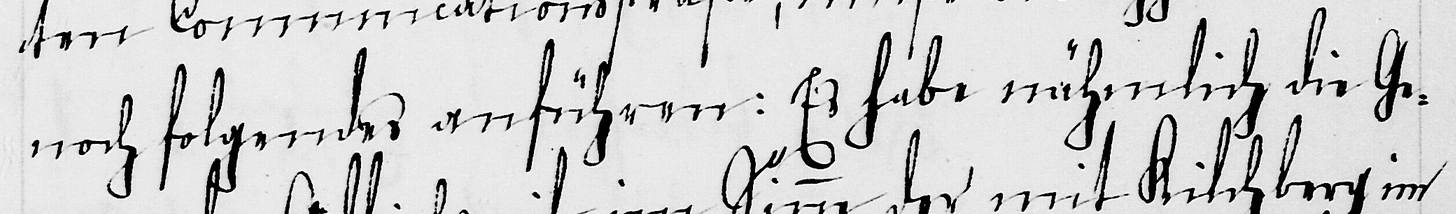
noch folgendes anführen: Es habe nähmlich die Ge¬
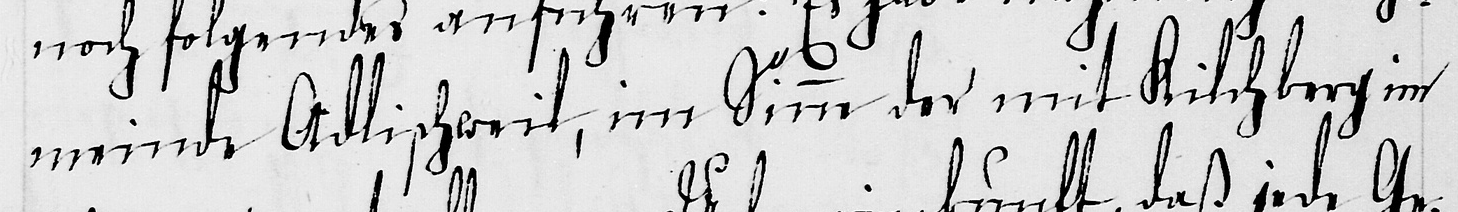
meinde Adlischweil, im Sinne der mit Kilchberg im
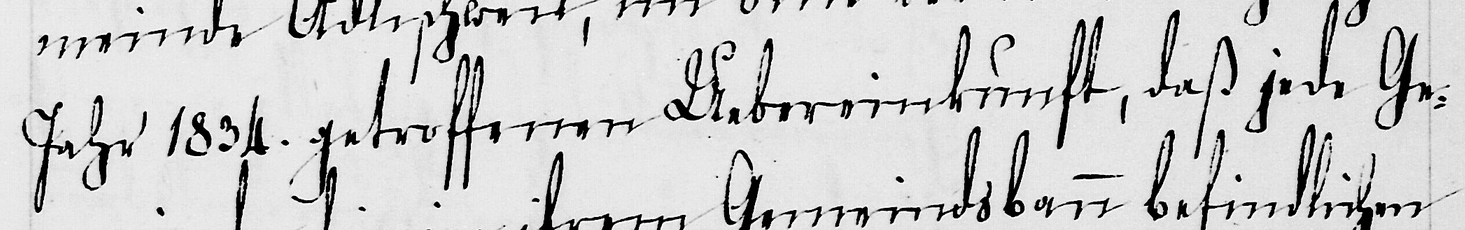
Jahr 1834. getroffenen Uebereinkunft, daß jede Ge¬
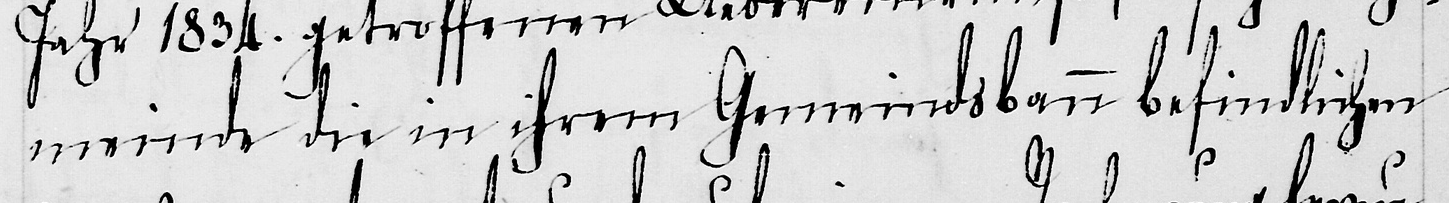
meinde die in ihrem Gemeindsbann befindlichen
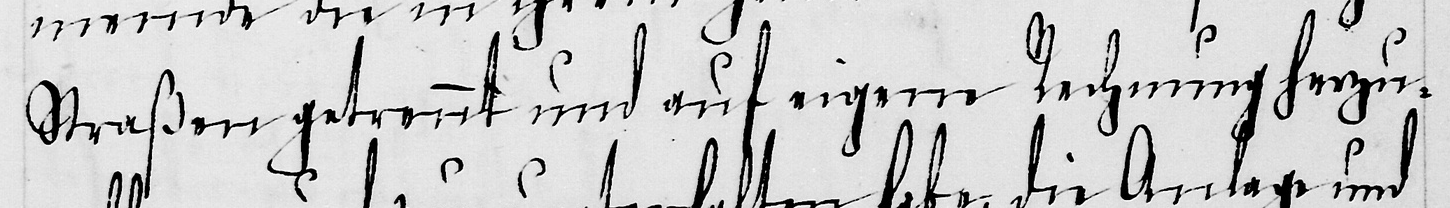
Straßen getrennt und auf eigene Rechnung herzu¬
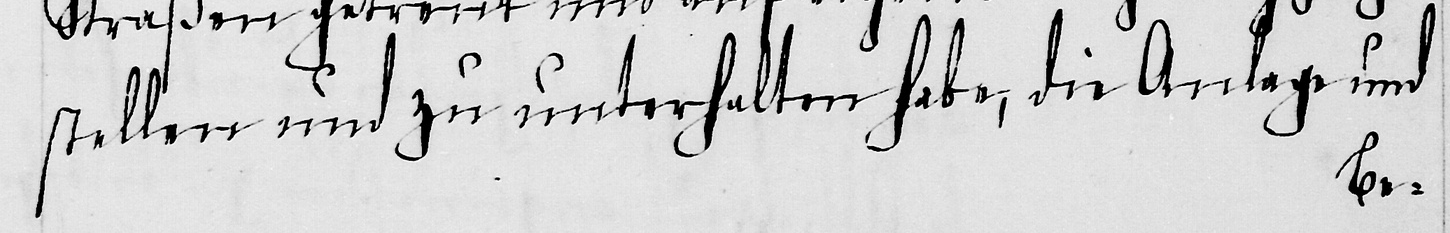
stellen und zu unterhalten habe, die Anlage und
